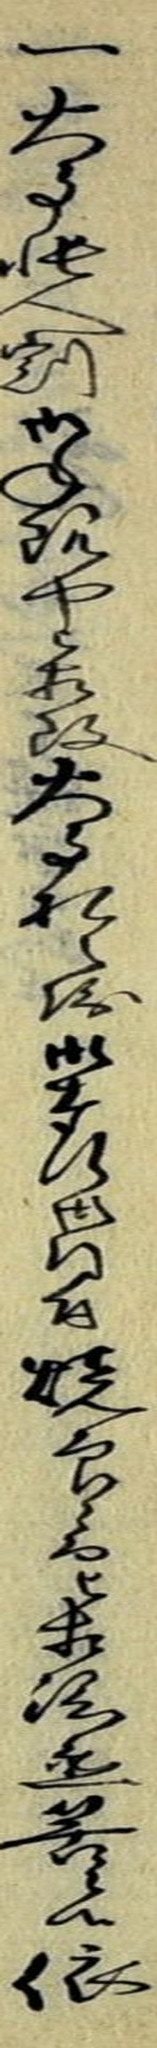一火事帳人割御年限中被相改火事札之儀御奉行御目付焼印ニ而被相渡置筈ニ候依
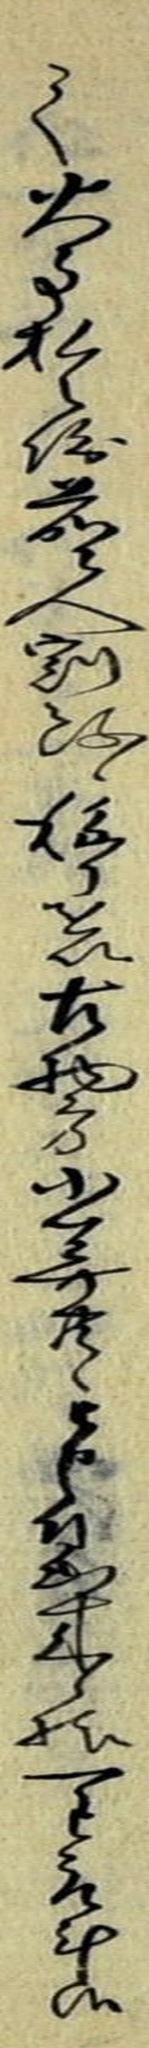之火事札之儀前々人割致候移りを以古物方小算共へ被申付出来候様可被取計候
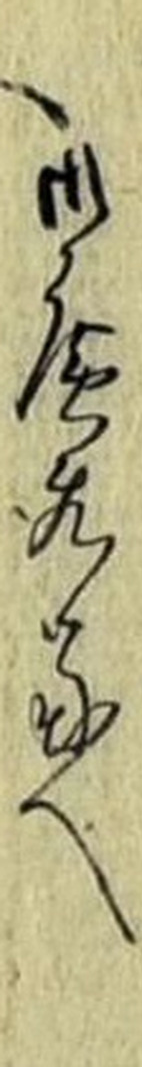御広敷御用人
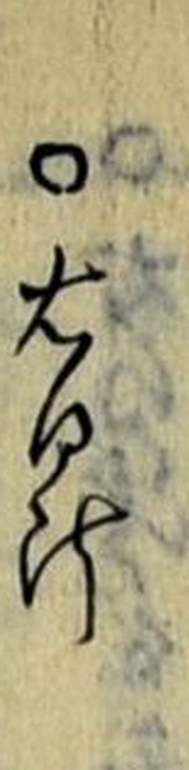〇右同断
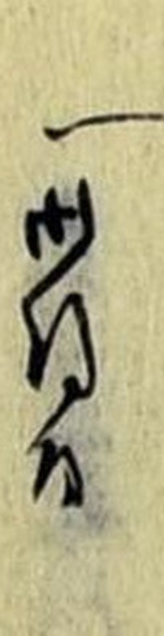御目付
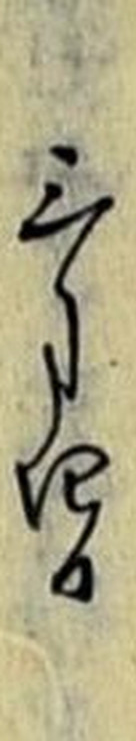三月四日
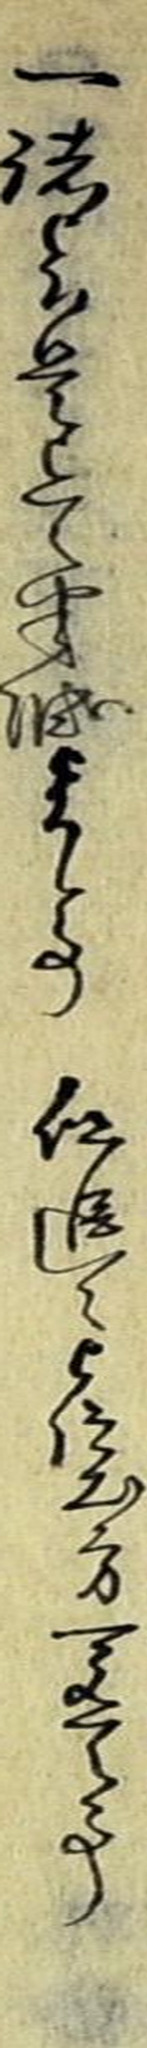一諸被下是迄之半減被下候事但追々被仰出方可有之事
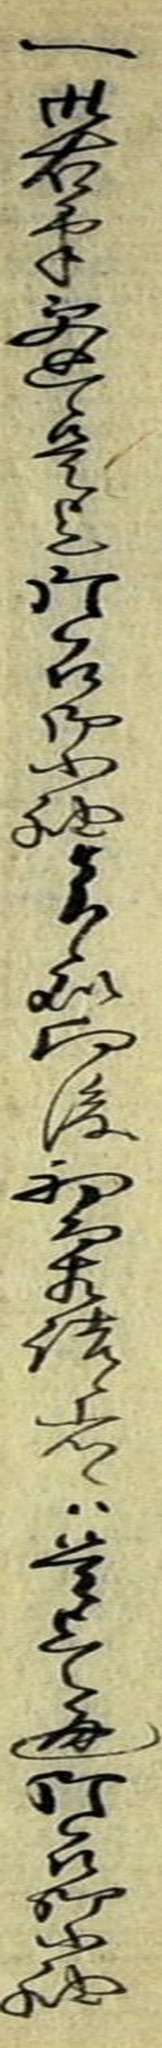一御右筆受込是迄御召御小袖被下候所向後初而相詰候者ヘハ是迄之通御召御小袖
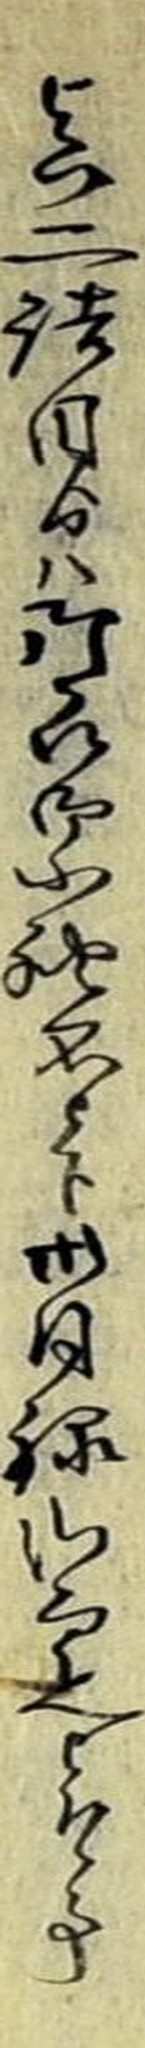被下二詰目ゟハ御召御小袖不被下御目録弐百疋被下候事
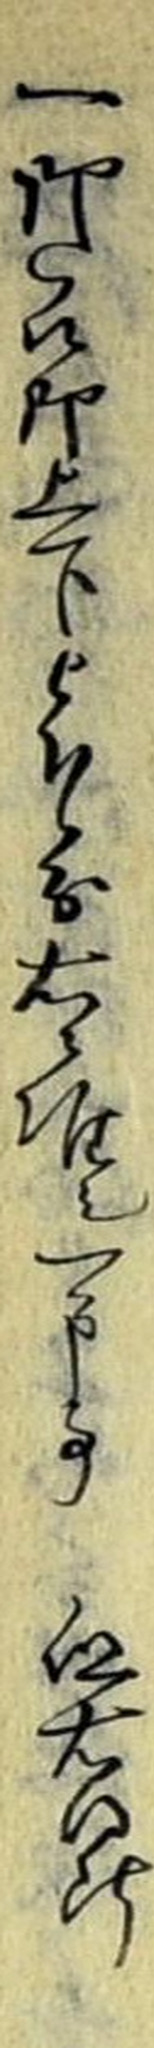一御召御上下被下候分右ニ准シ可申事但右同断
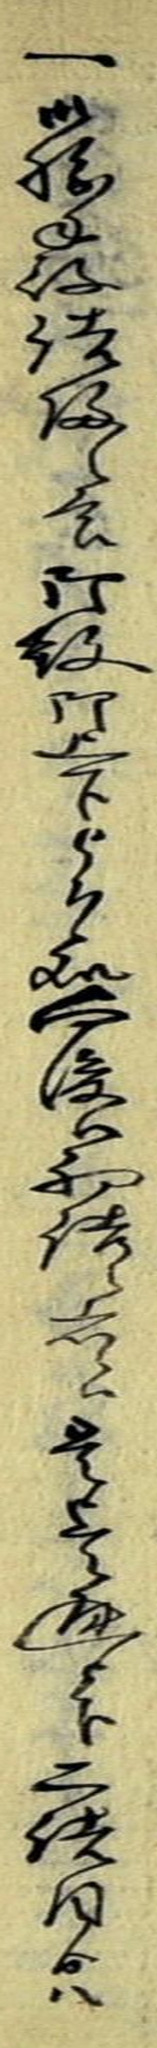一御勝手役結構之節御紋御上下被下候処向後ハ初詰之者ヘハ是迄之通被下二詰目ゟハ

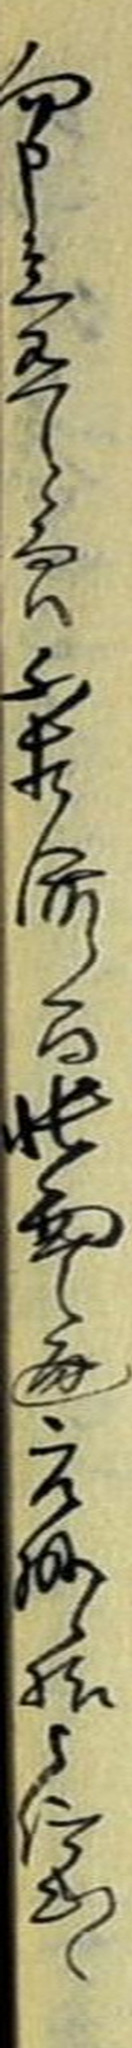向申立有之候而ハ不相済候間帳面之通取扱候様被仰出候
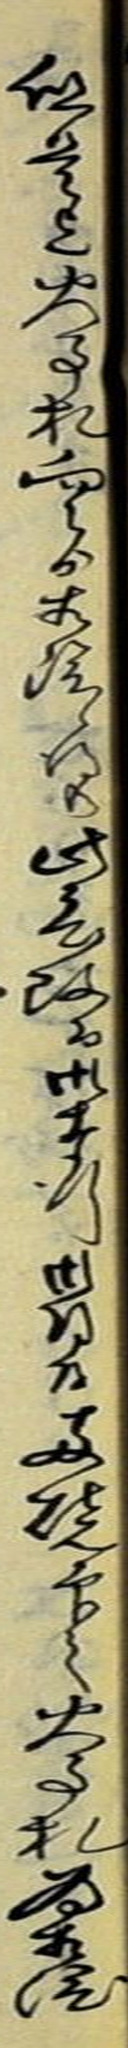但是迄火事札向々ゟ相渡候得共此度改而御奉行御目付両焼印之火事札為相渡

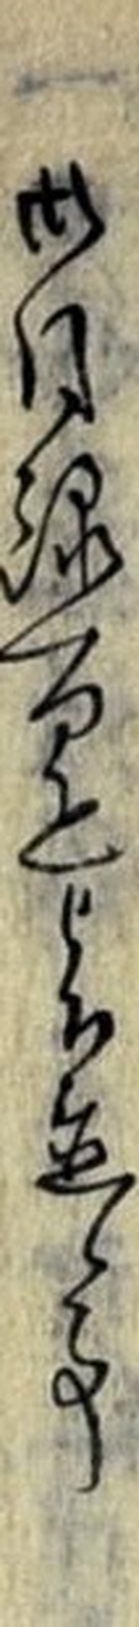御目録百疋被下置候事
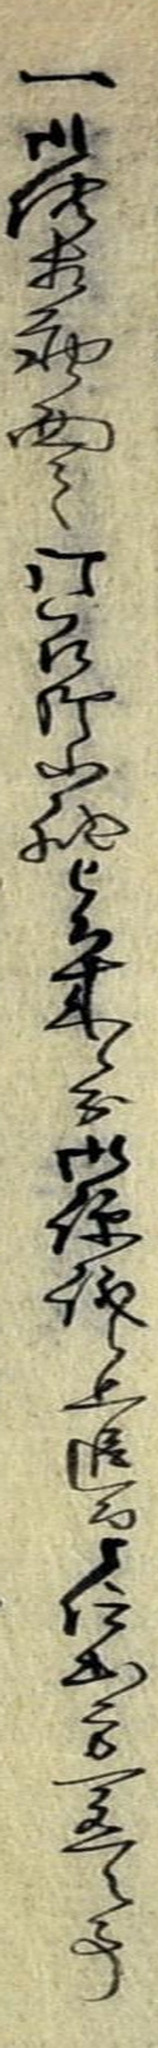一御供相勤候面々へ御召御小袖被下来候分御評議之上追而被仰出方可有之事
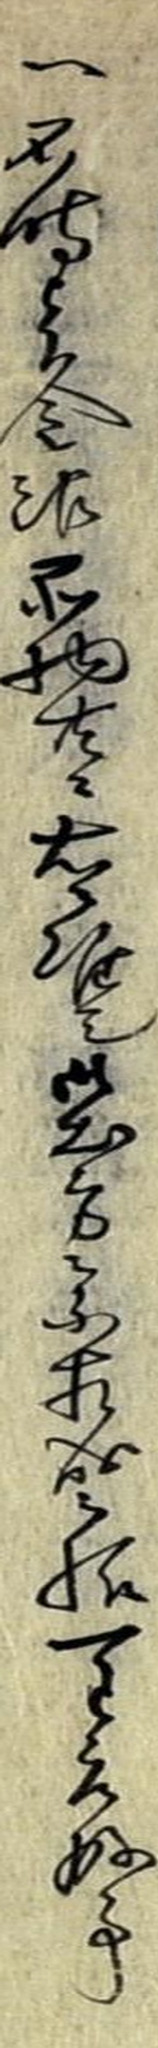一不時被下金銀品物共ニ右ニ准シ御出方ニ不相成候様可被取扱事
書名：命令之部 三
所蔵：福井県文書館 Fukui Prefectural Archives
